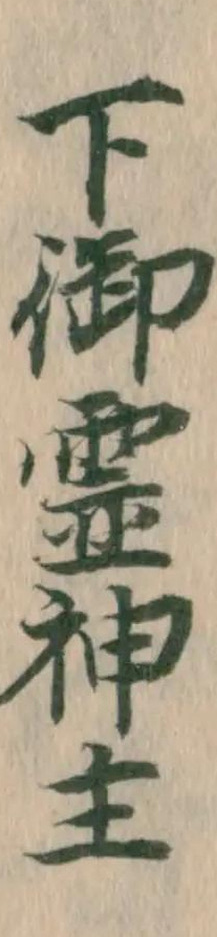下御霊神主

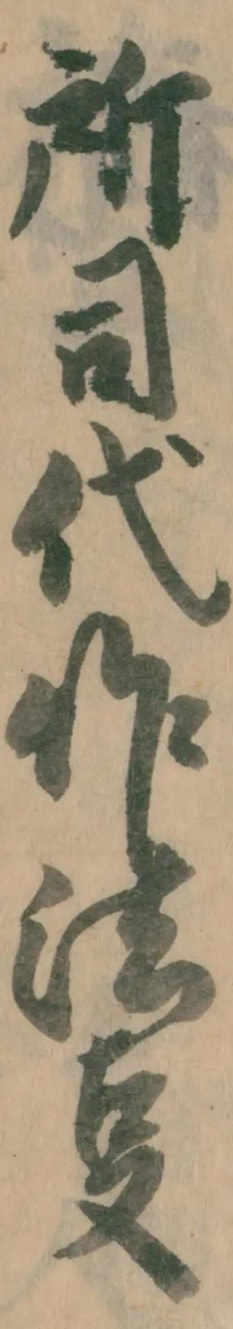所司代作法事
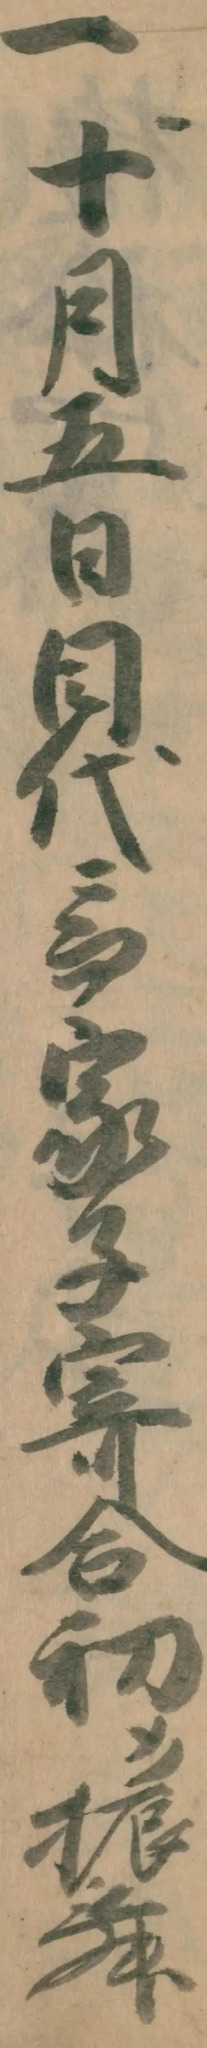一十月五日目代ニ而家子寄合初メノ振舞
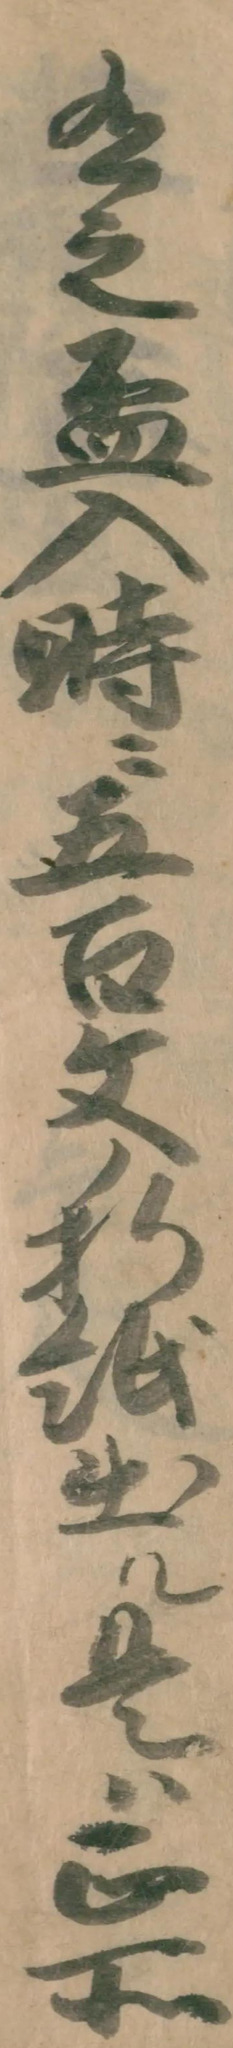有之盃入時ニ五百文ノ折紙出ル是ハ正所
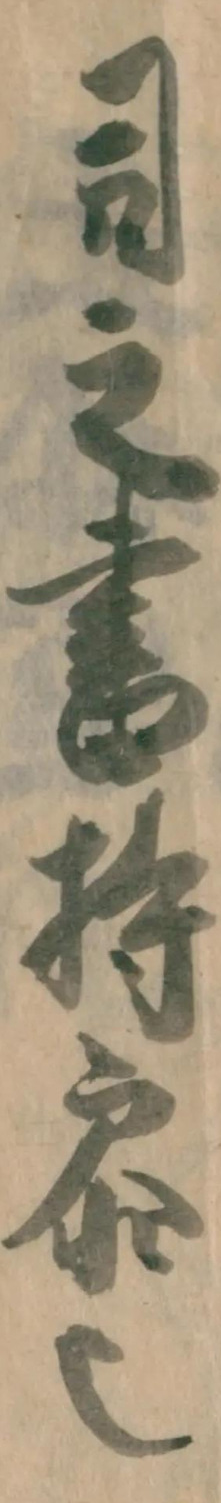司之書持参也
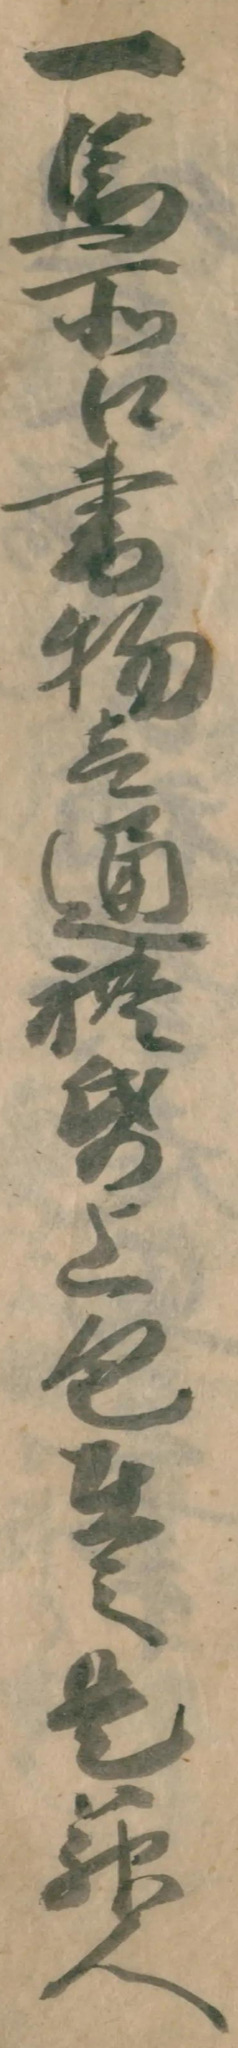一馬所江書物壱通礼紙上包在之是ハ神人
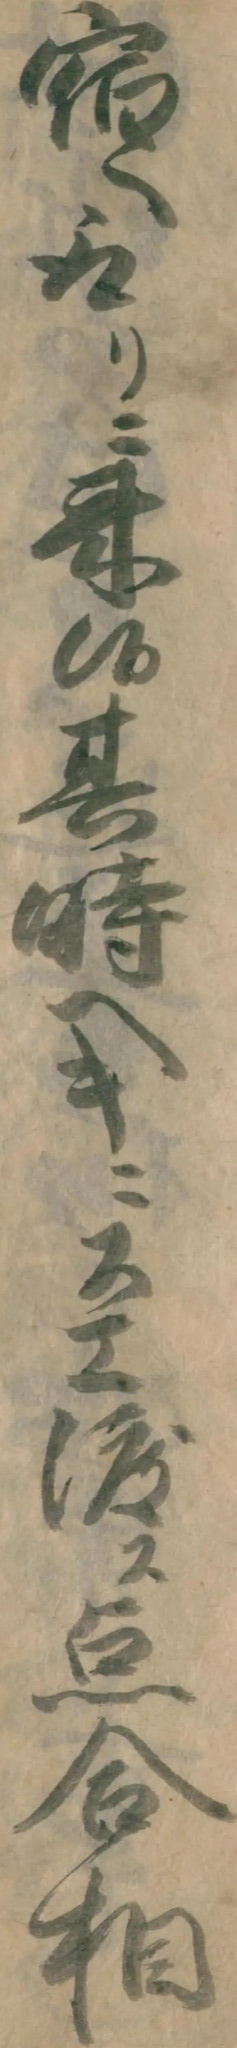宿へ取リニ来候其時ヘキニスエ渡ス点合相

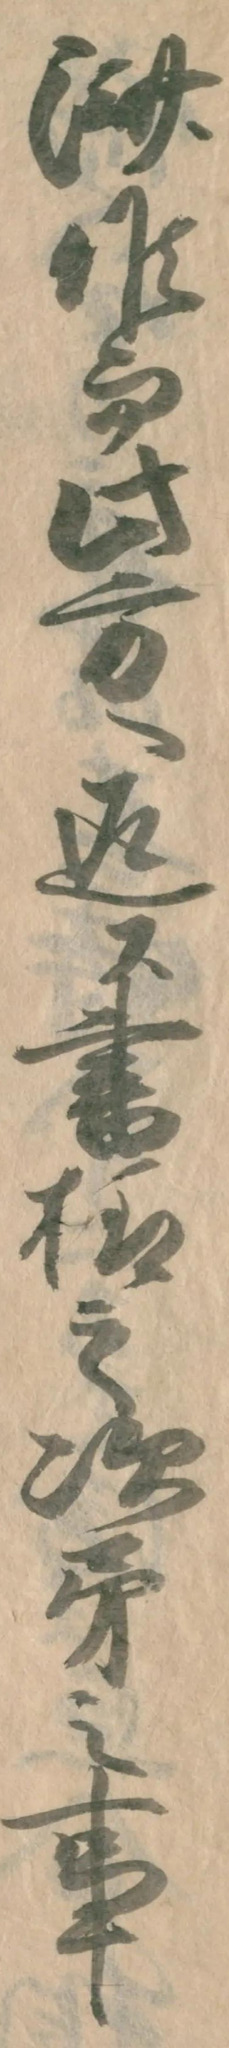済候而此方へ返ス書様之次第之事
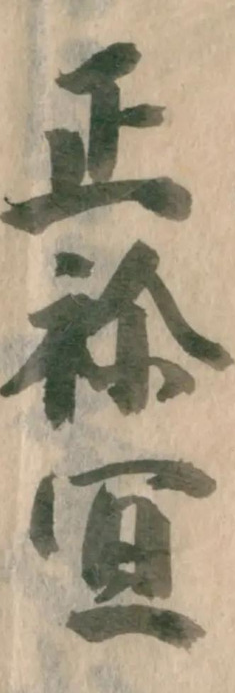正祢宜
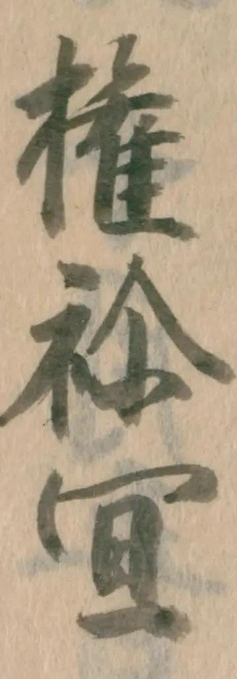権祢宜
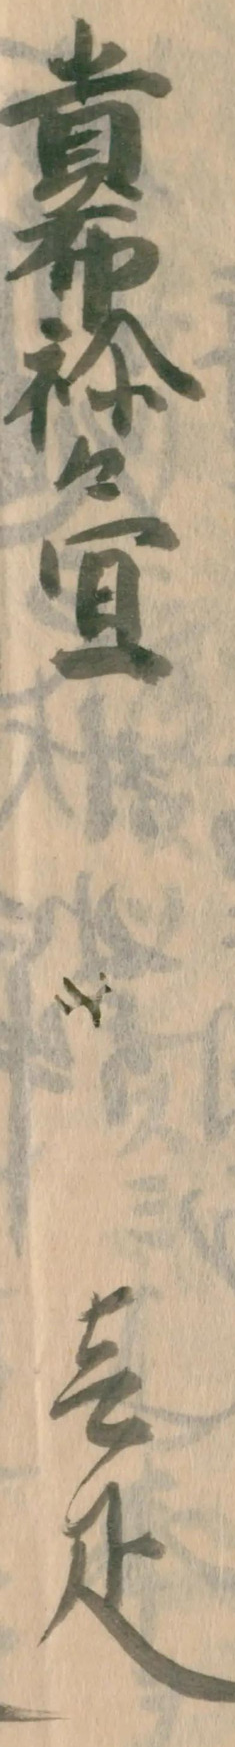貴布祢々宜壱疋
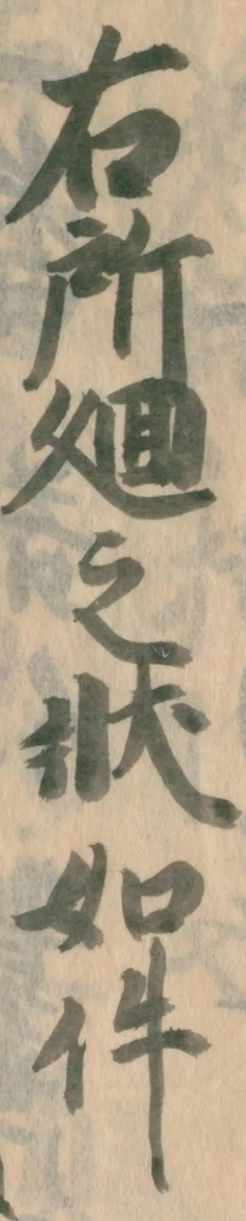右所廻之状如件
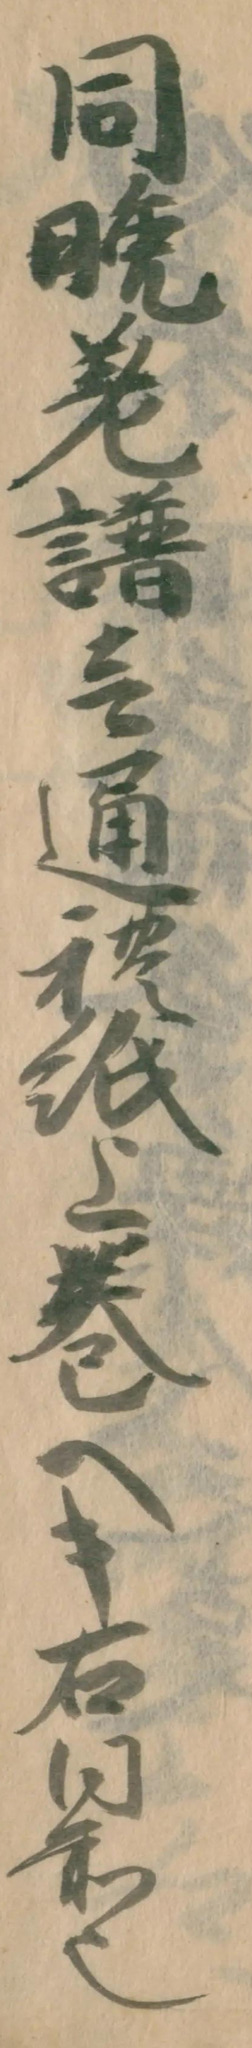同晩老譜壱通礼紙上巻へキ右同前也

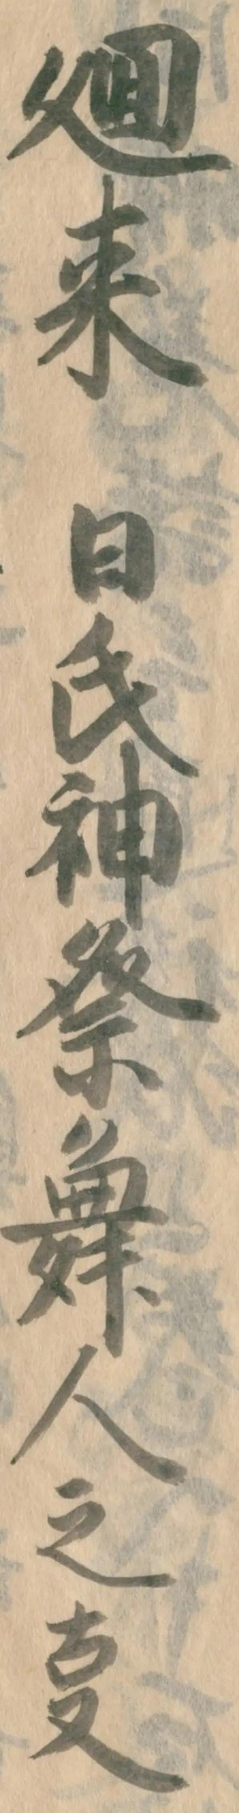廻来日氏神祭舞人之事
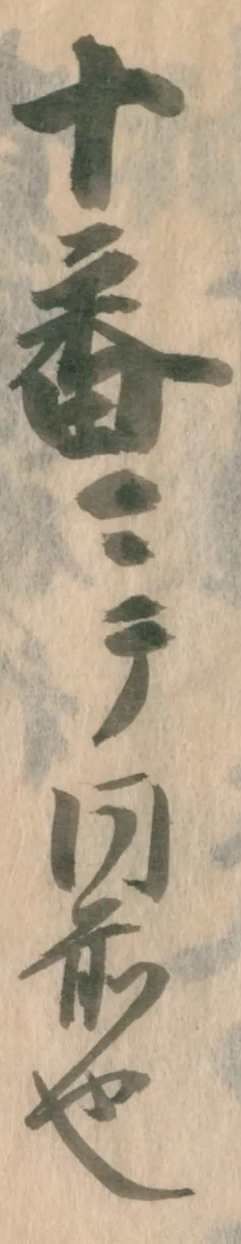十番マテ同前也
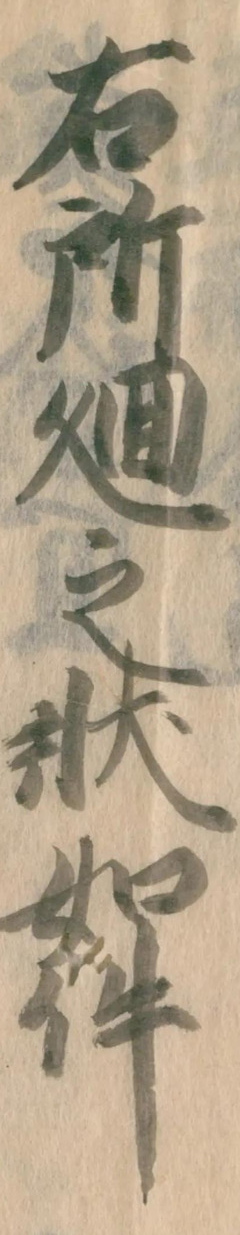右所廻之状如件
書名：賀茂社記録. 第91冊
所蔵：国立国会図書館 National Diet Library, JAPAN
